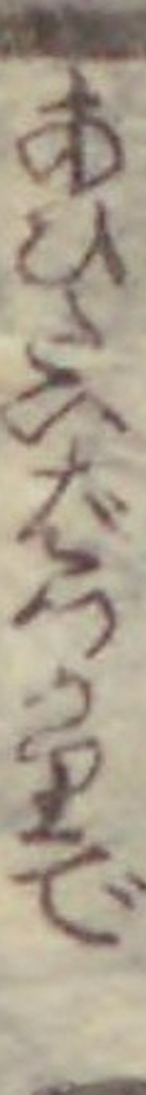あひたいばつかりで
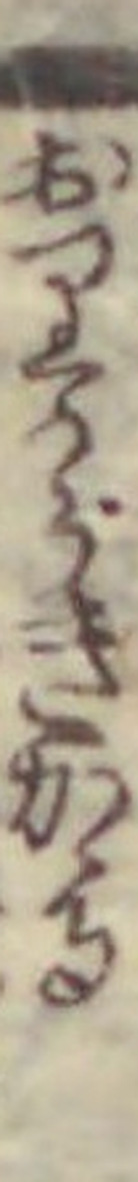おりからきかゝる
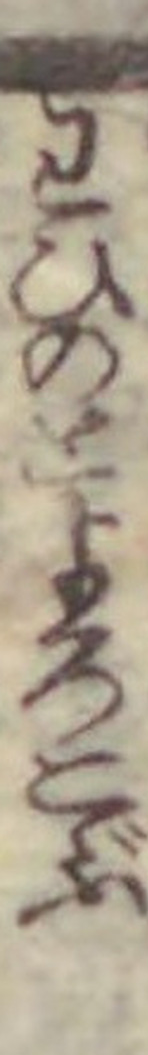わひのとよろこぶ
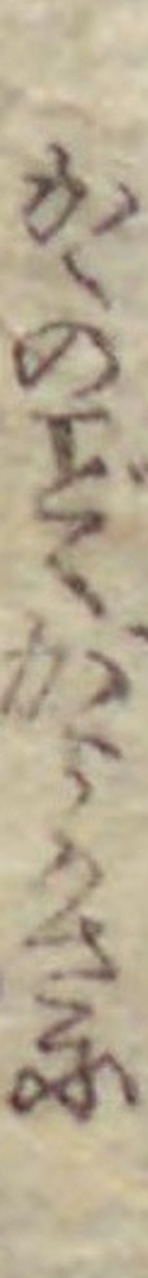かくのごとくからかさに
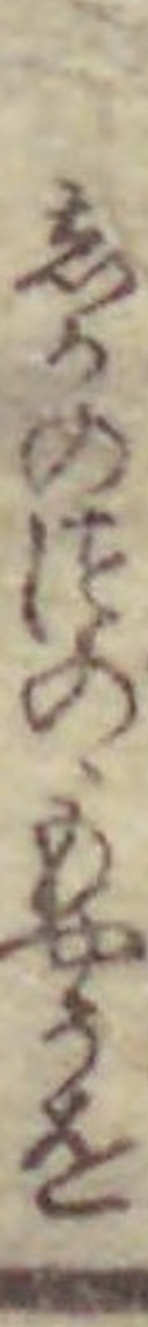しかのつのもやうを
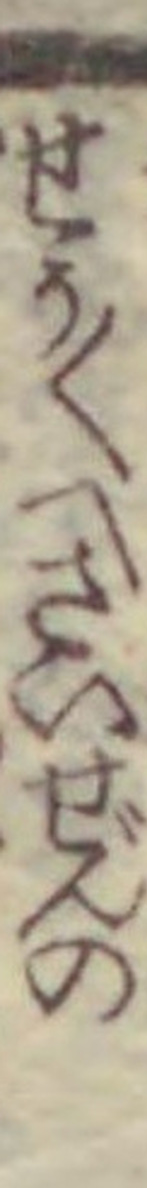せう〳〵〽さいぜんの
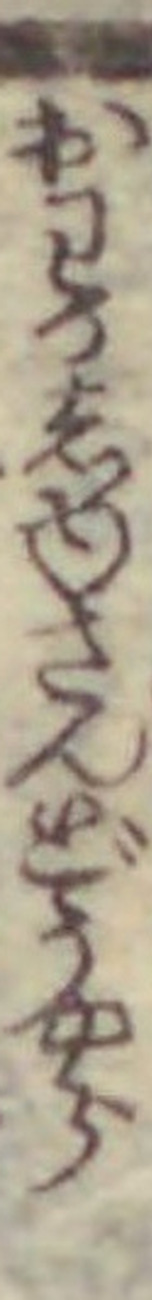おわかしゆさんどうやら
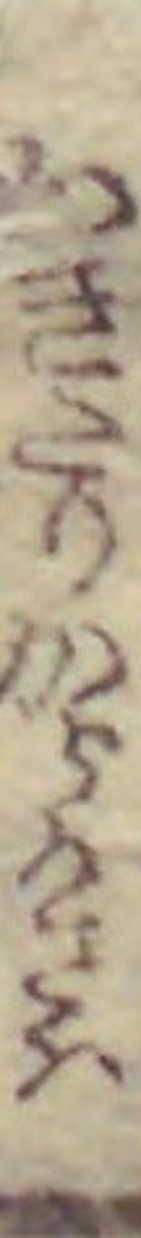かきたりからかさは
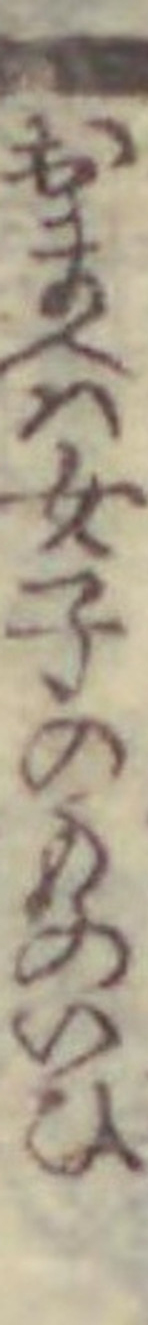おまへは女子のものいひ
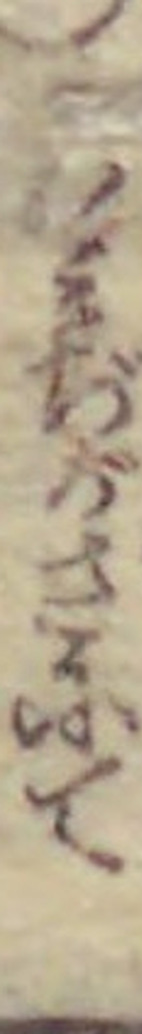もみぢがさにて
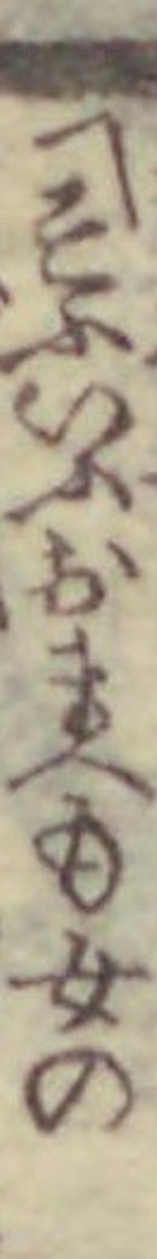〽そふいふおまへも女の
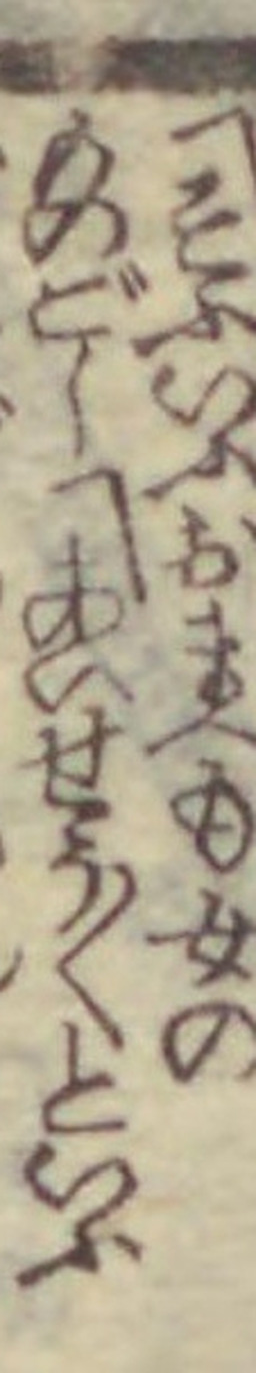ものごし〽あいせう〳〵といふ
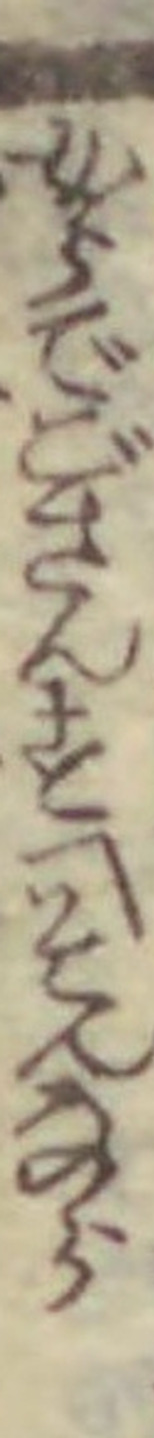女郎でごさんす〽そんなら
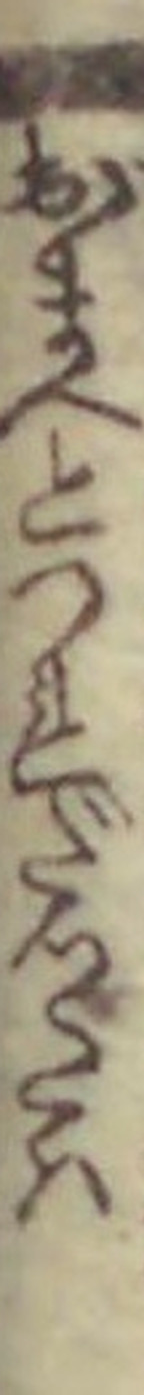おまへとつれだつたは
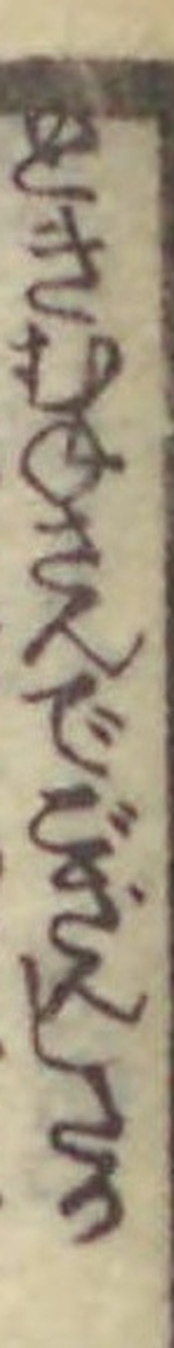ときむねさんでござんしたか
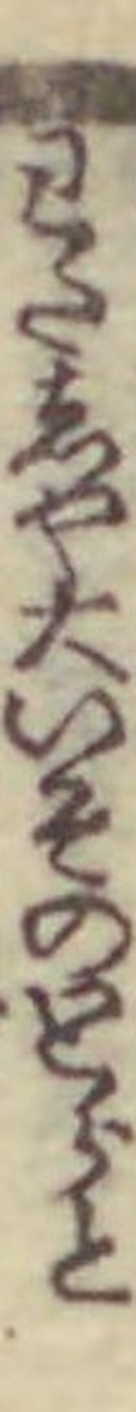わたしや大いそのとらと
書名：大時代唐土化物 3巻. 曽我太夫染
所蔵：国立国会図書館 National Diet Library, JAPAN
